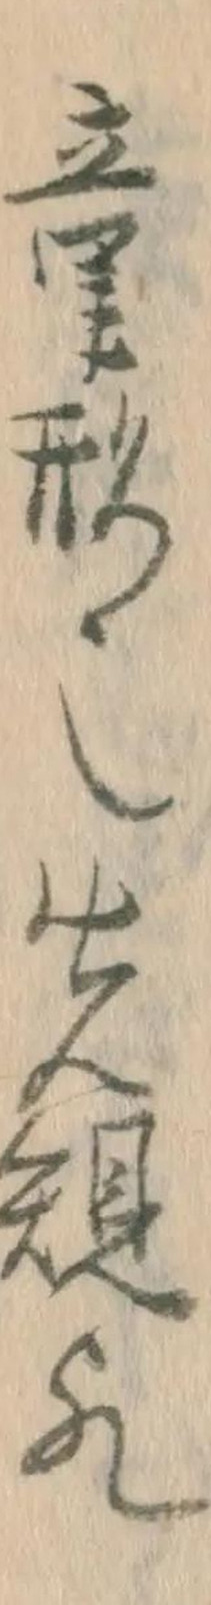童形也先規歟
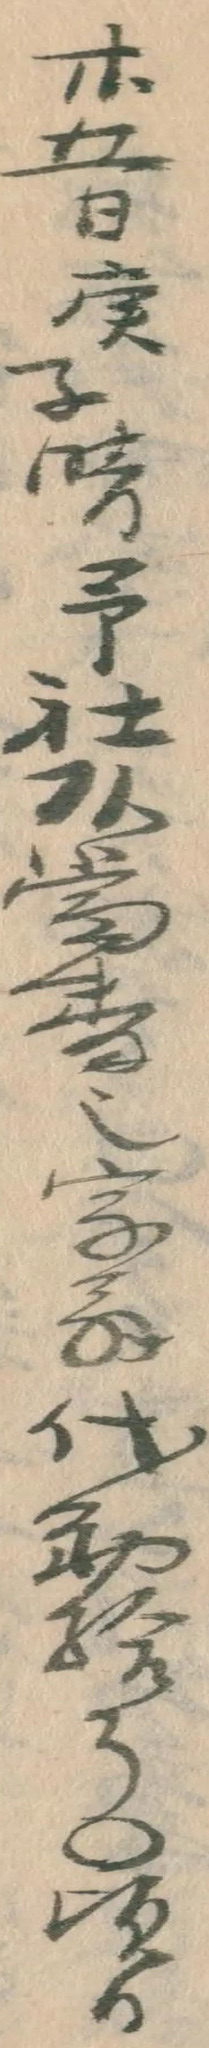廿五日庚子晴予社頭當番春也家翁代勤給了〇頃日
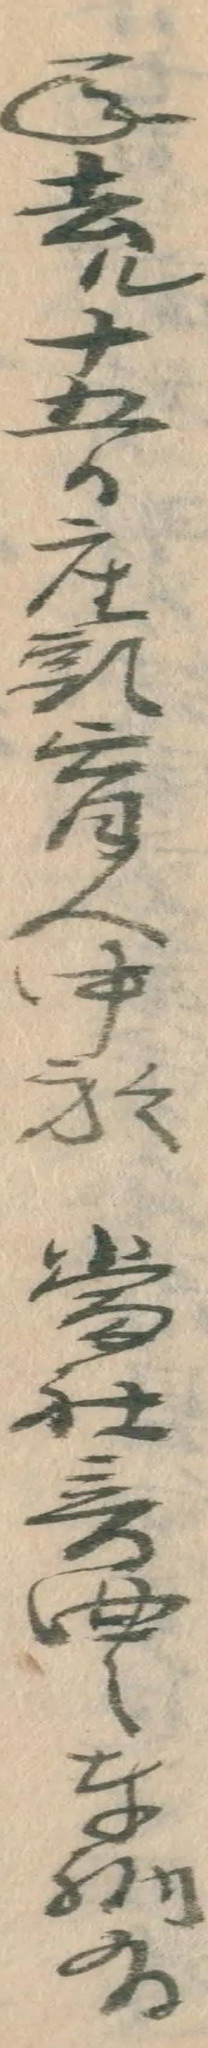年去ル十五日座頭盲人中於當社音曲之奉納有
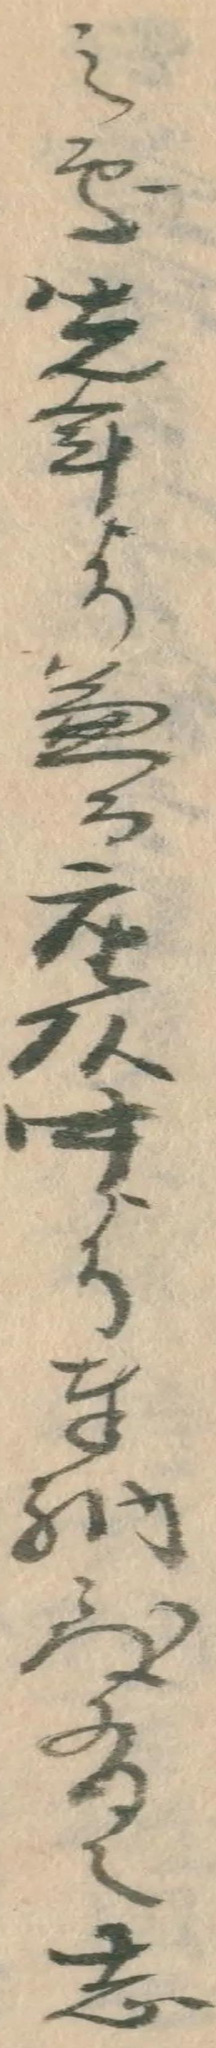之處先年より兼而座頭中より奉納致有之志
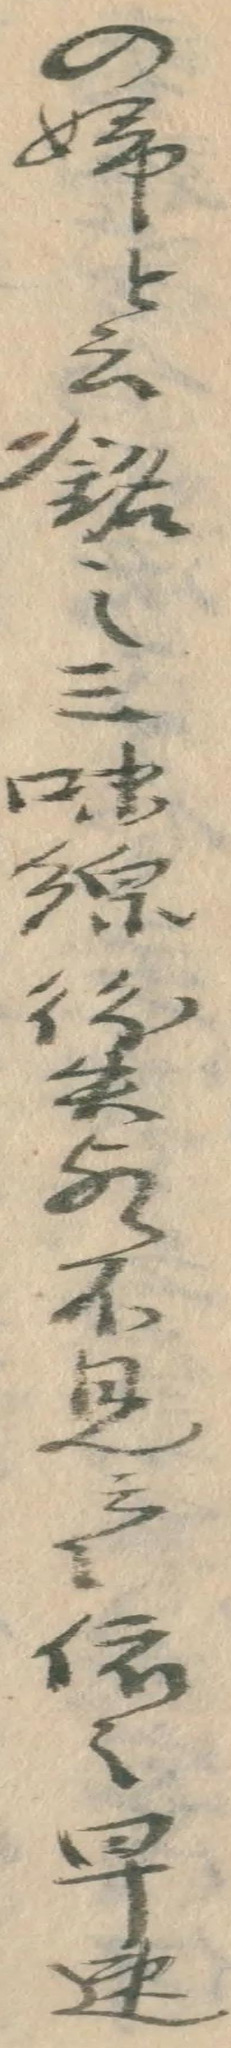の婦と云銘之三味線紛失歟不見云々依之早速
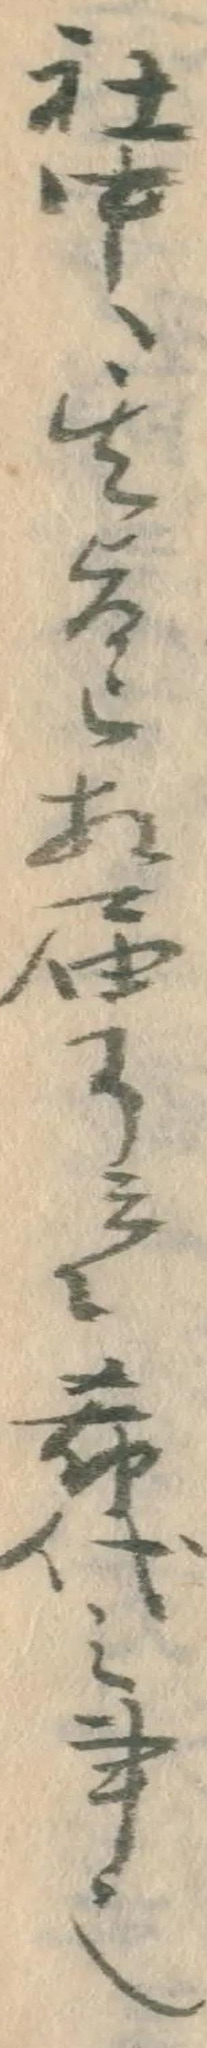社中へ其旨被相届有云々希代之事也

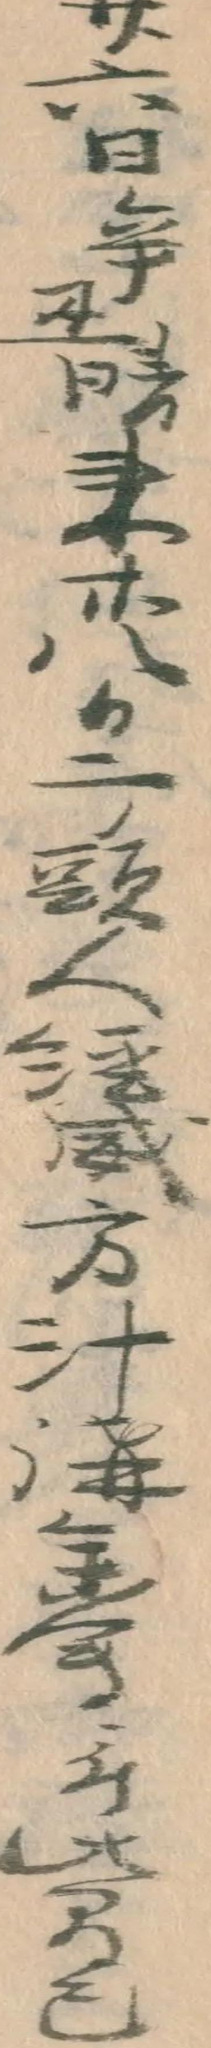廿六日辛丑晴来廿八日二ノ頭人経威方汁溝参會ニ付此間已
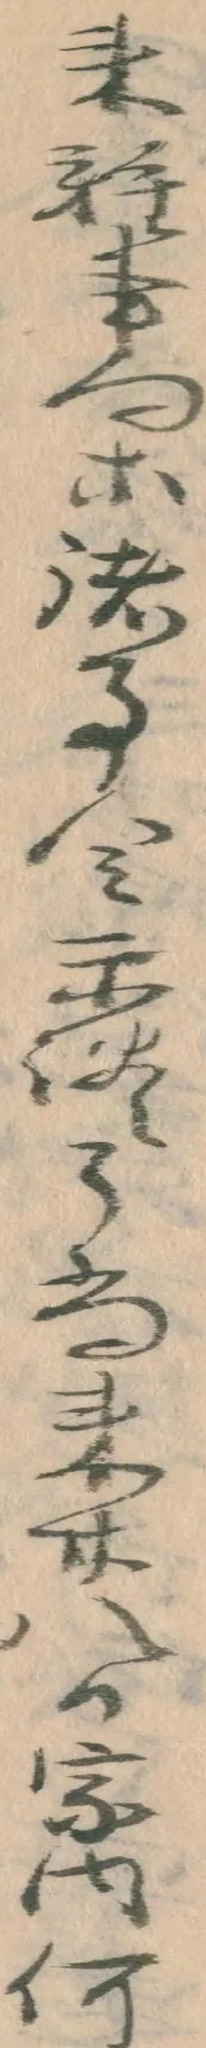来難事向等諸事令示談了當来廿八日家内何
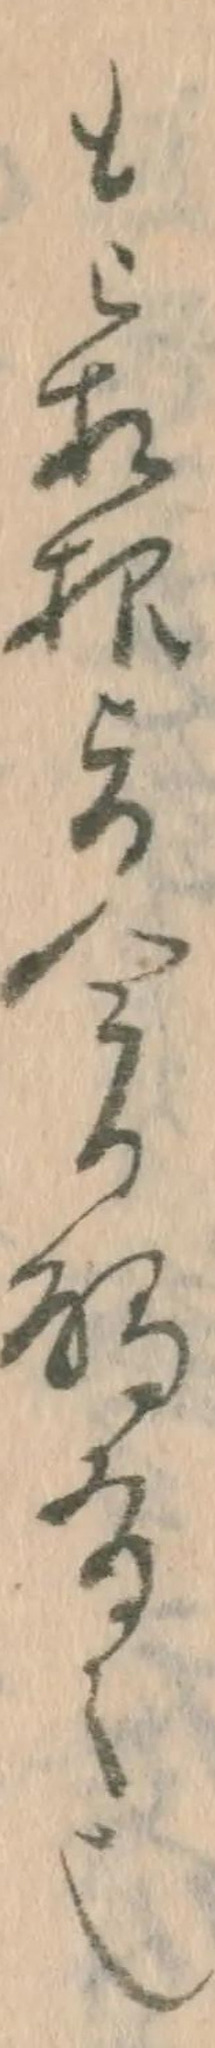も被相招旨今日触有之也
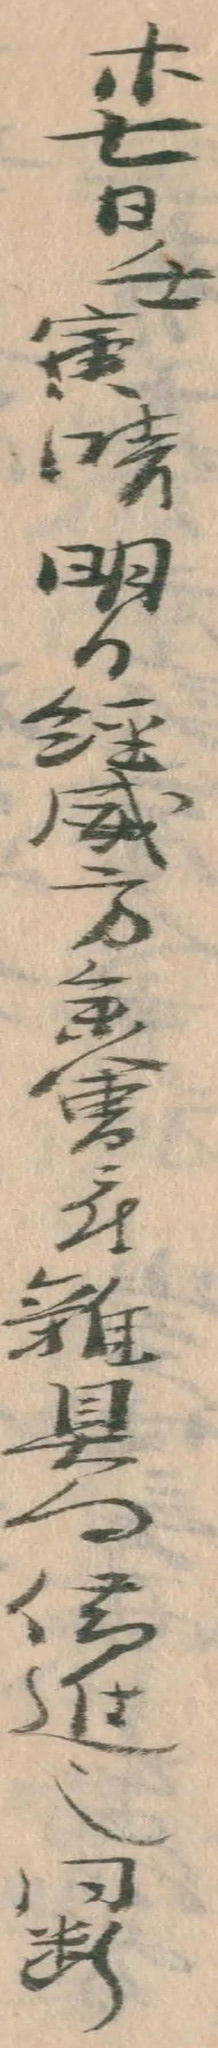廿七日壬寅晴明日経威方参會ニ付雑具為借進也同断
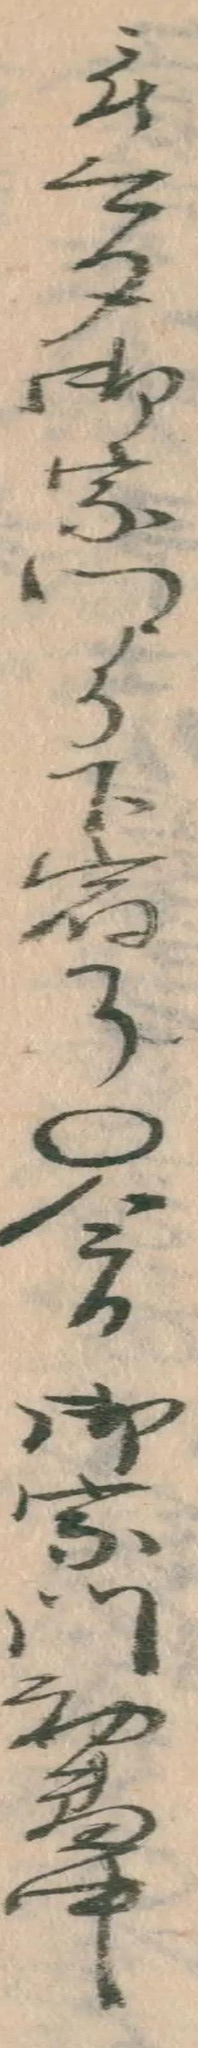ニ付今夕御家門より下宿了○今日御家門勤番中
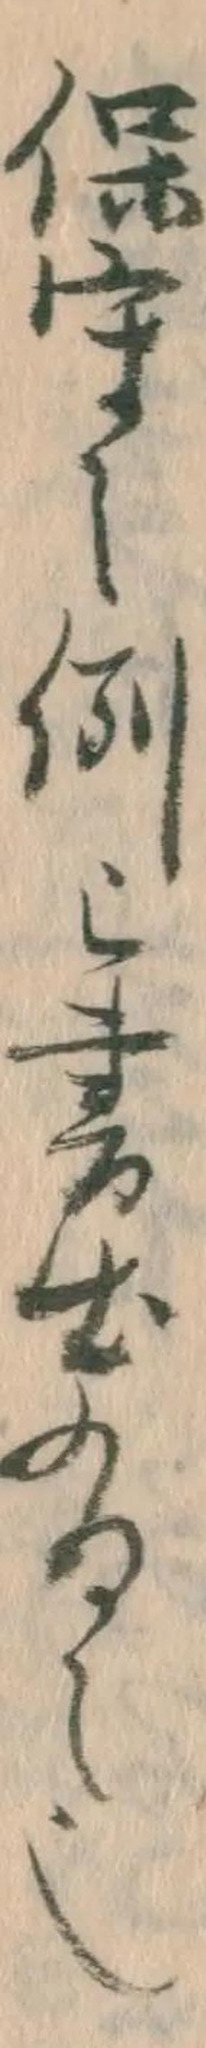保守之例被書出有之也
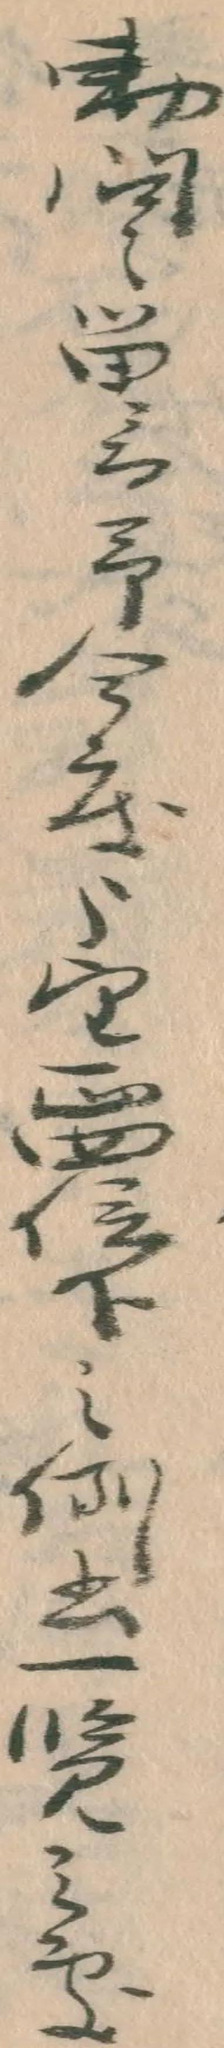勅問之留ニ而予今度被望正四位下之例書一覧之處
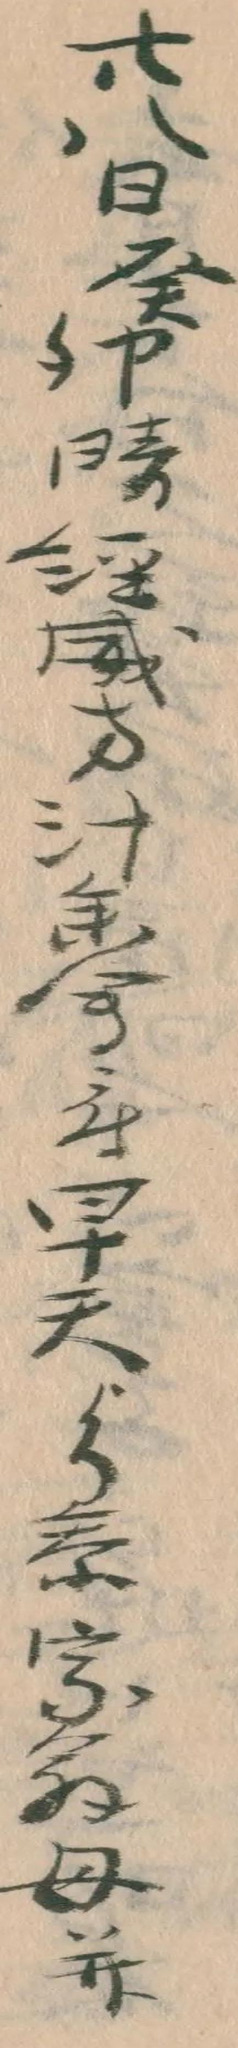廿八日癸卯晴経威方汁参會ニ付早天より参家翁母幷
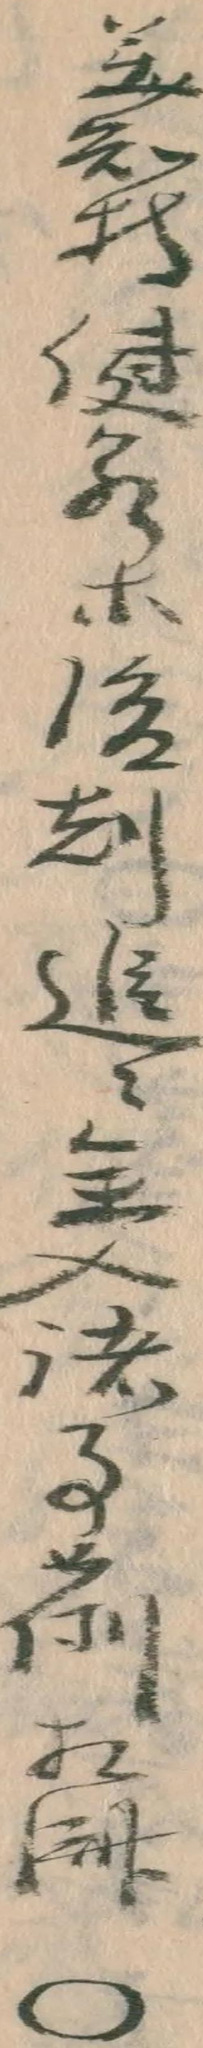美知持健若等後刻追々参入諸事如例相済○
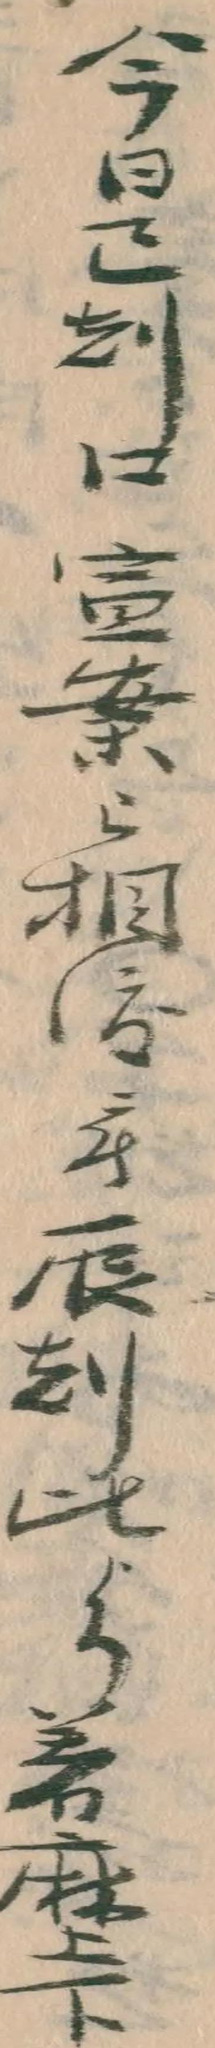今日巳刻口宣案被相渡ニ付辰刻比より着麻上下
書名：賀茂社記録. 第63冊
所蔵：国立国会図書館 National Diet Library, JAPAN
